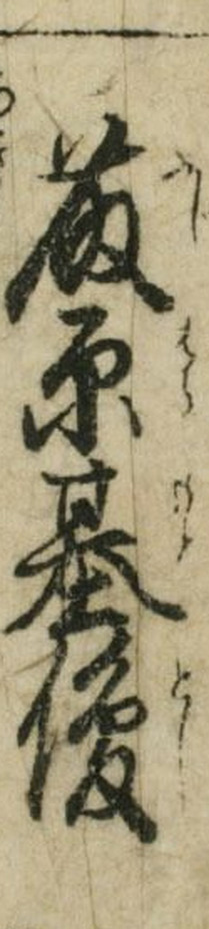藤原基俊
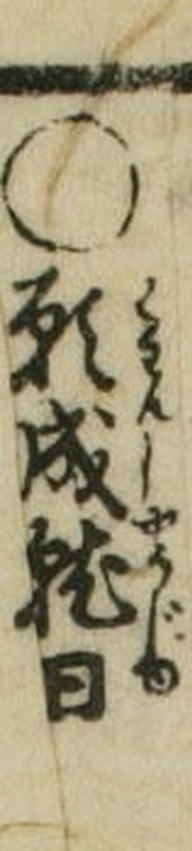○願成就日
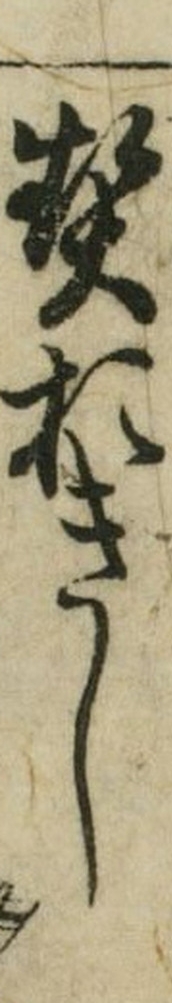契おきし
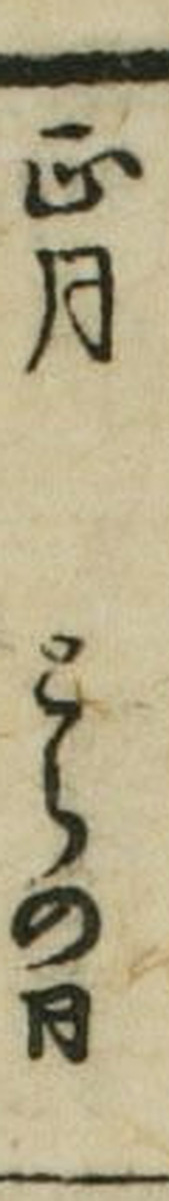正月とらの日
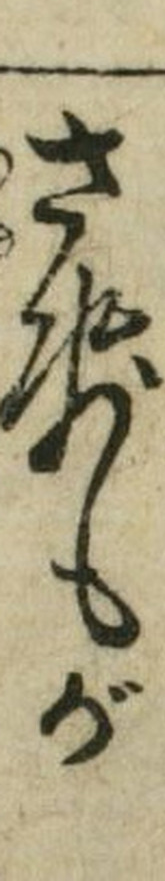させもが
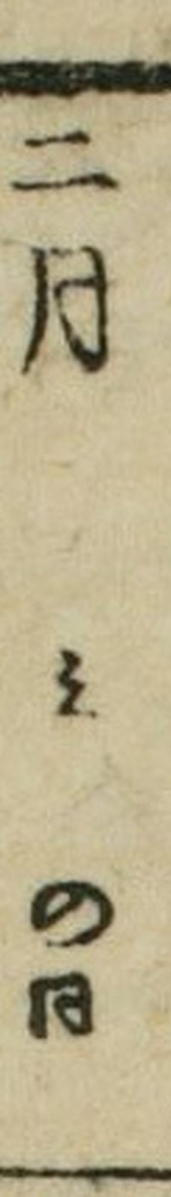二月みの日
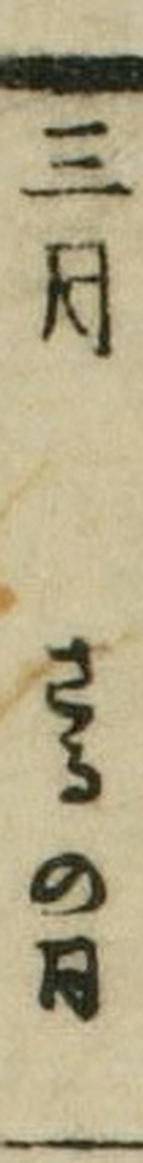三月さるの日
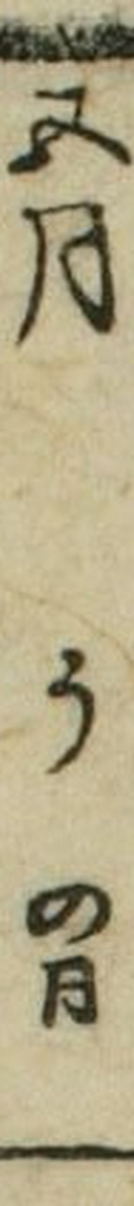五月うの日
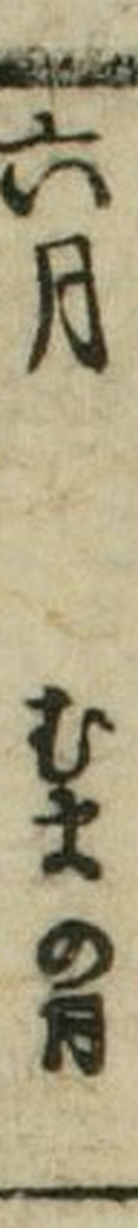六月むまの日
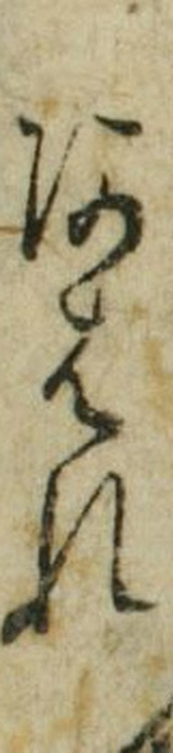あはれ
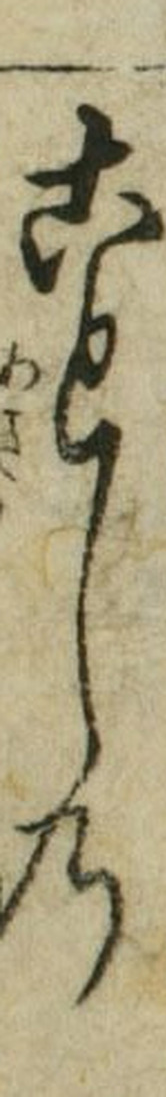ことしの
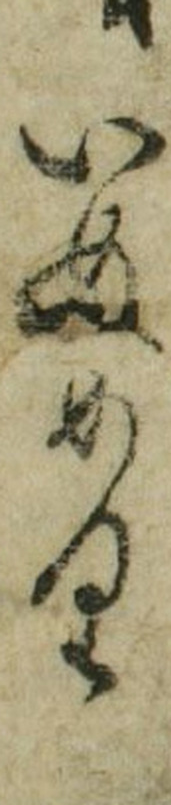いぬめり

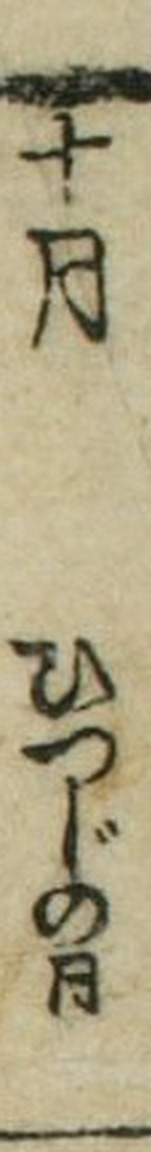十月ひつじの日
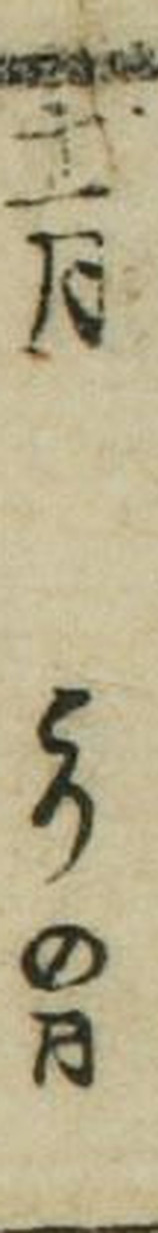十一月とりの日
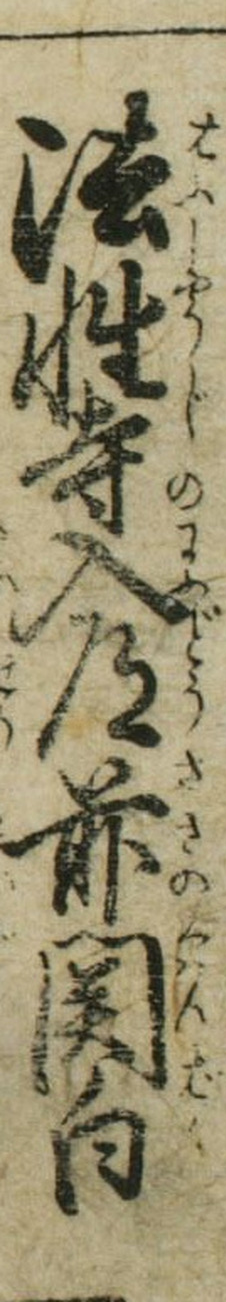法性寺入道前関白
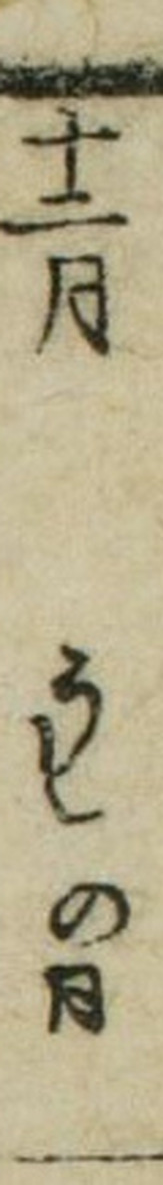十二月うしの日
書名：百人一首
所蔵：東京学芸大学教育コンテンツアーカイブ
